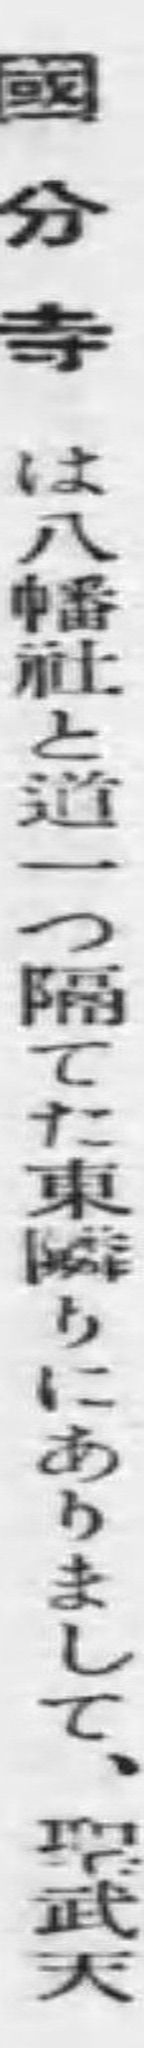国分寺は八幡社と道一つ隔てた東隣りにありまして、聖武天
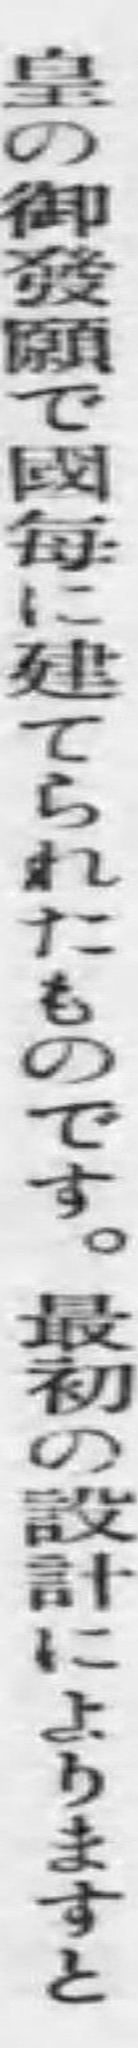皇の御発願で国毎に建てられたものです。最初の設計によりますと
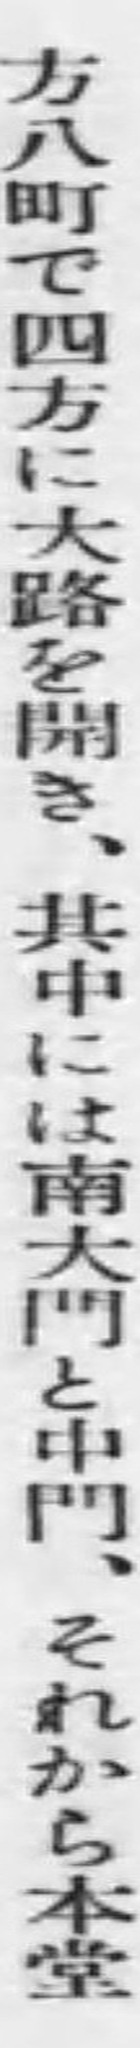方八町で四方に大路を開き、其中には南大門と中門、それから本堂
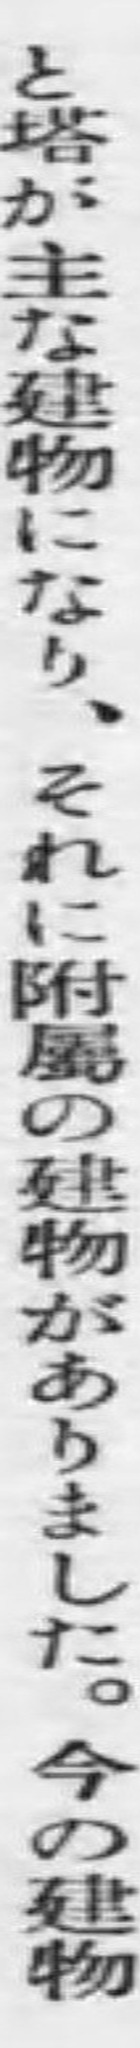と塔が主な建物になり、それに附属の建物がありました。今の建物
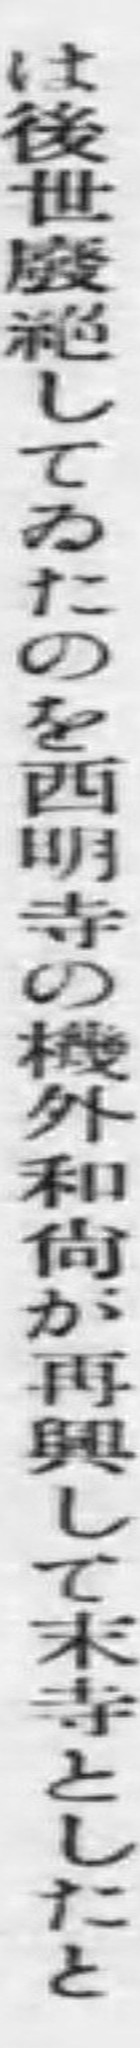は後世廃絶してゐたのを西明寺の機外和尚が再興して末寺としたと
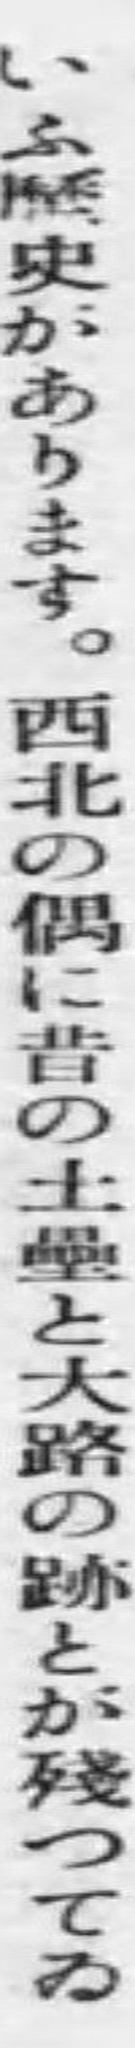いふ歴史があります。西北の偶に昔の土塁と大路の跡とが残つてゐ
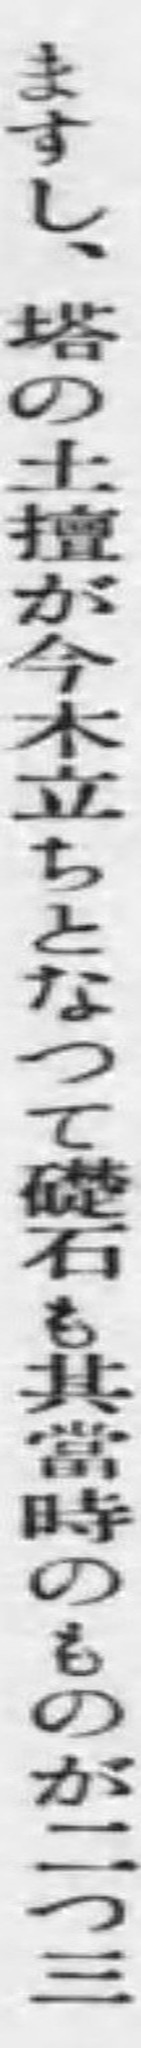ますし、塔の土擅が今木立ちとなつて礎石も其当時のものが二つ三
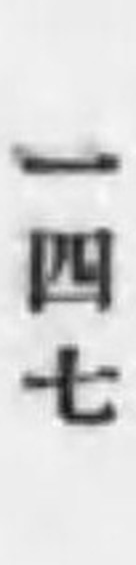一四七

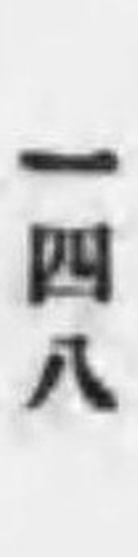一四八
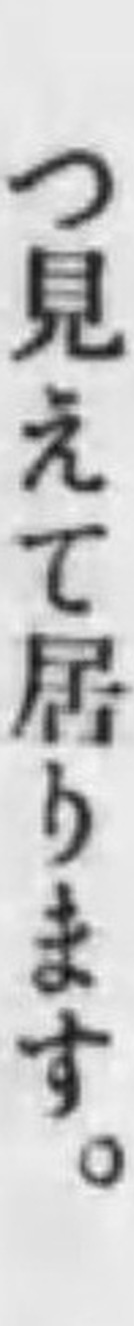つ見えて居ります。
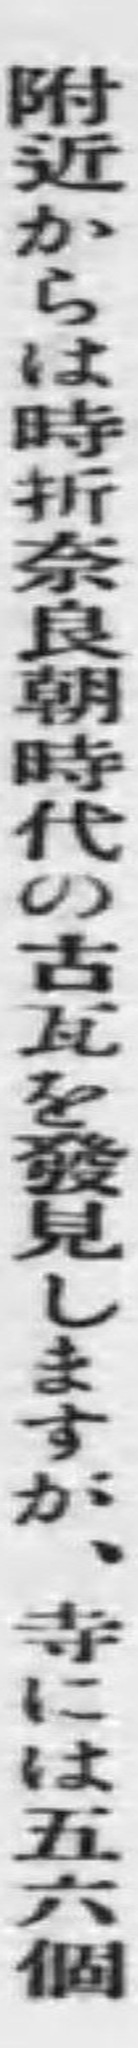附近からは時折奈良朝時代の古瓦を発見しますが、寺には五六個
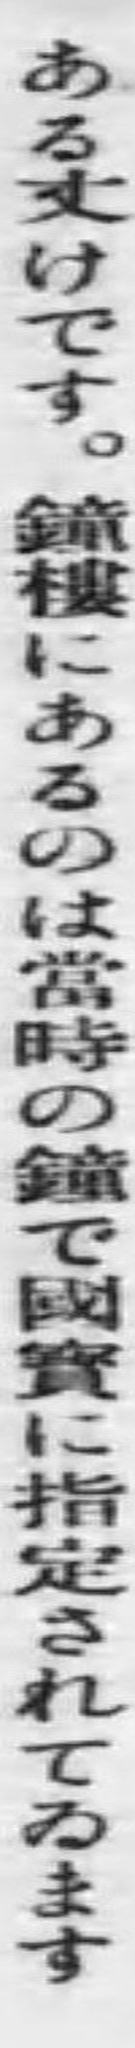ある丈けです。鐘楼にあるのは当時の鐘で国宝に指定されてゐます
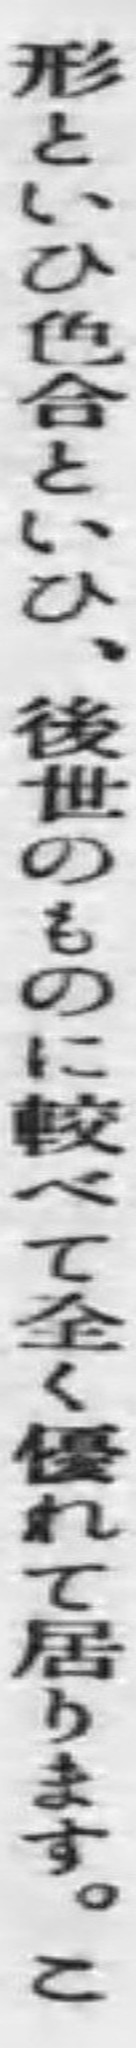形といひ色合といひ、後世のものに較べて全く優れて居ります。こ
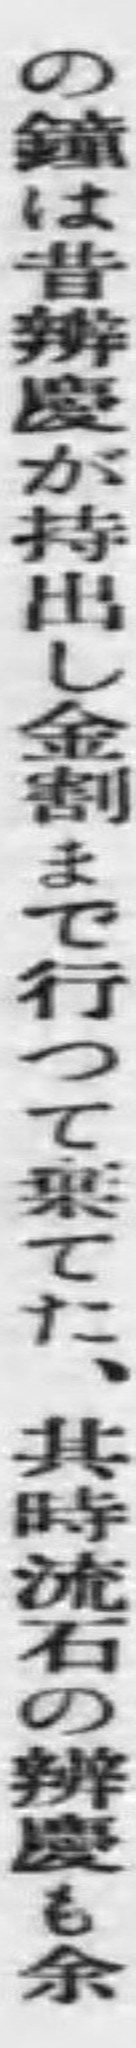の鐘は昔弁慶が持出し金割まで行つて棄てた、其時流石の弁慶も余
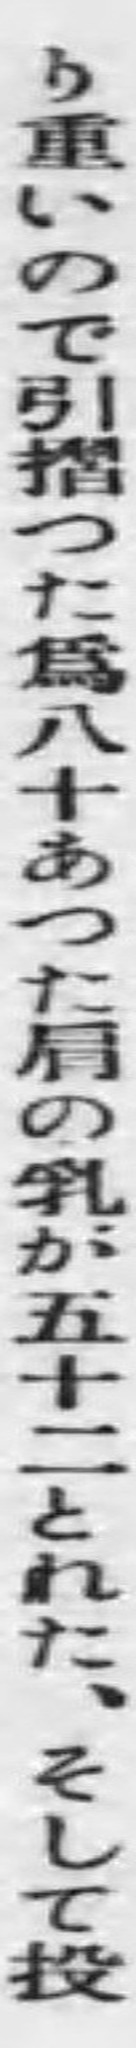り重いので引摺つた為八十あつた肩の乳が五十二とれた、そして投
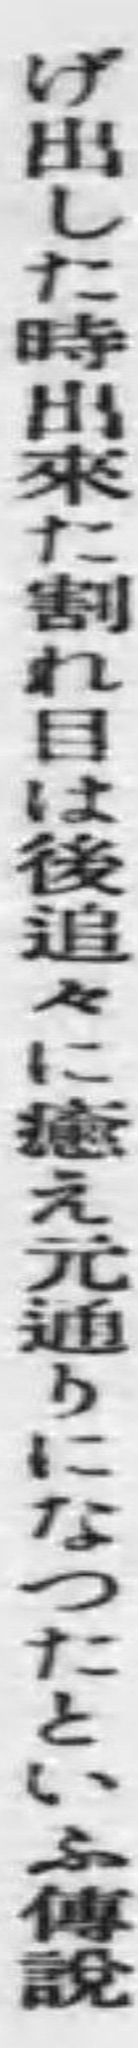げ出した時出来た割れ目は後追々に癒え元通りになつたといふ伝説
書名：東三河道中記 : 豊橋市及其附近案内
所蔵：国立国会図書館 National Diet Library, JAPAN
